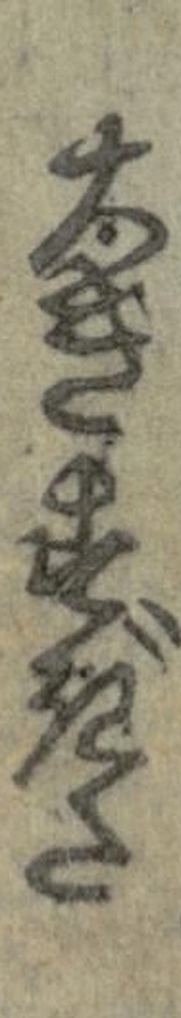大きすぎた
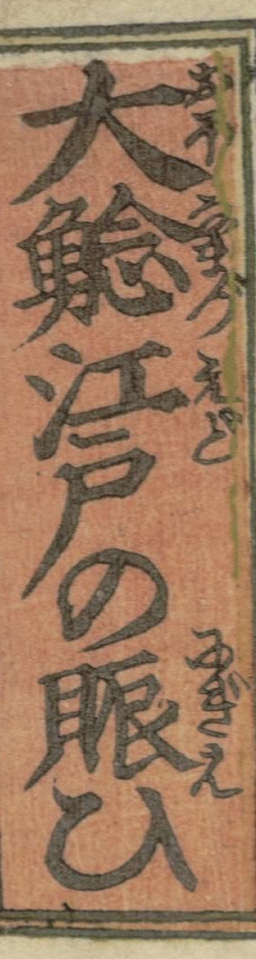大鯰江戸の賑ひ
